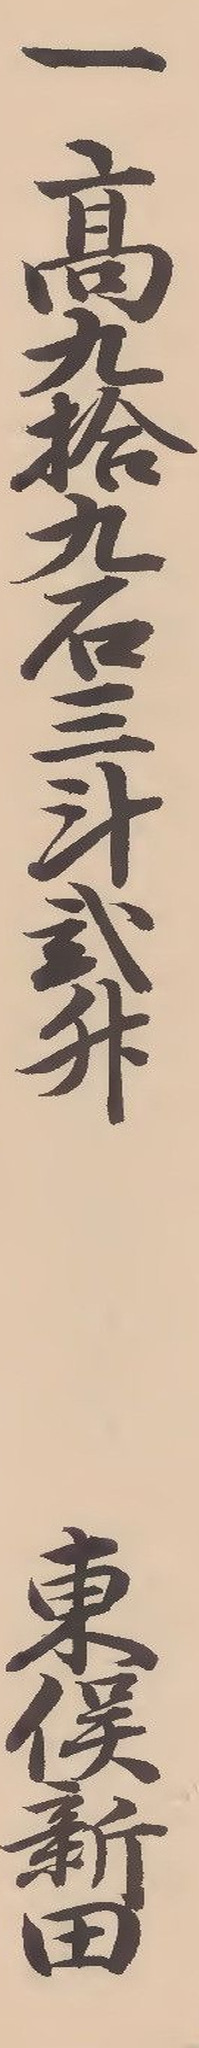一高九拾九石三斗弐升東俣新田
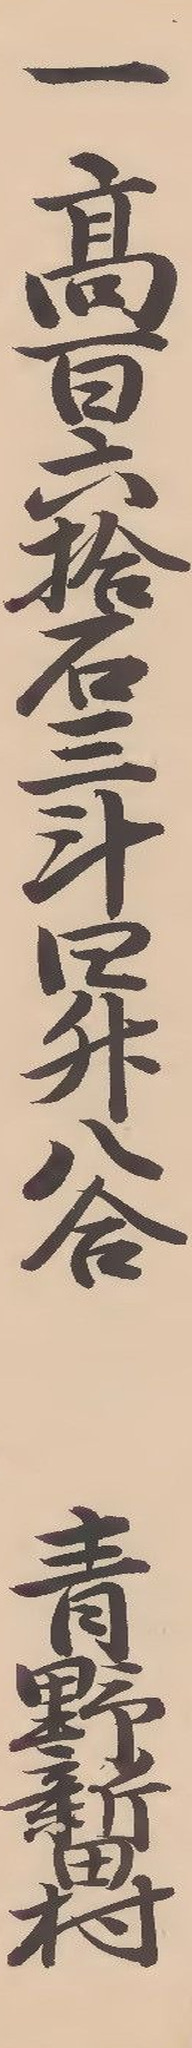一高百六拾石三斗四升八合青野新田村
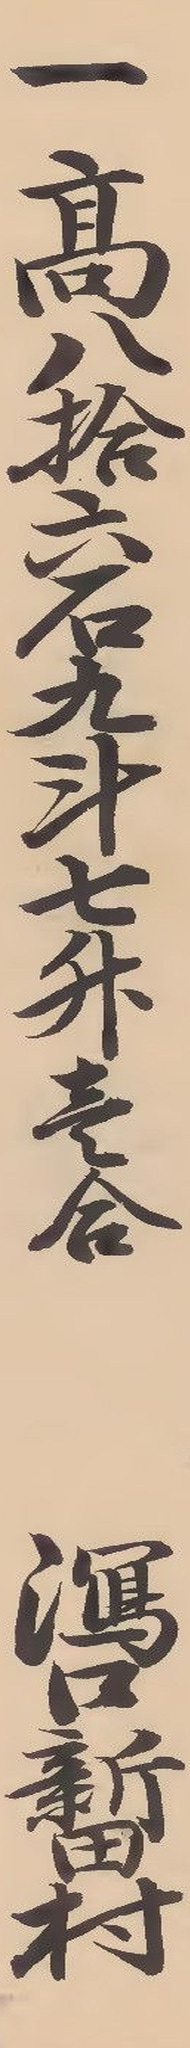一高八拾六石九斗七升壱合潟口新田村
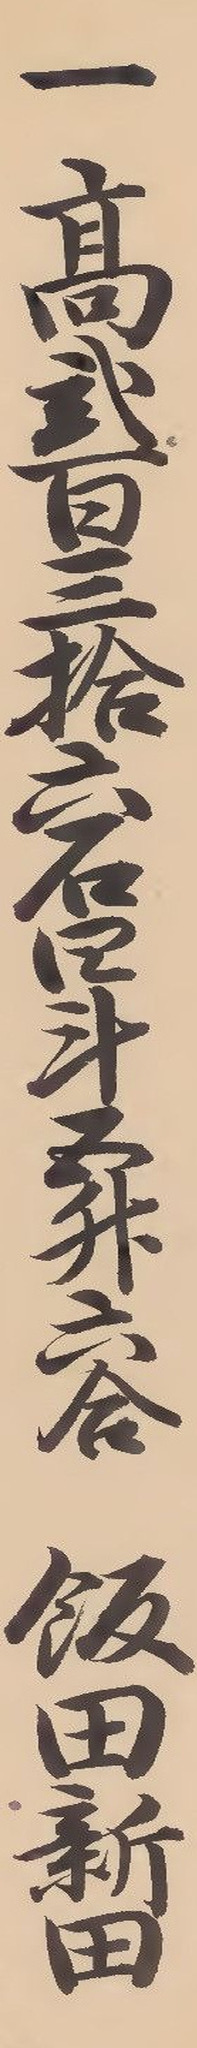一高弐百三拾六石四斗五升六合飯田新田
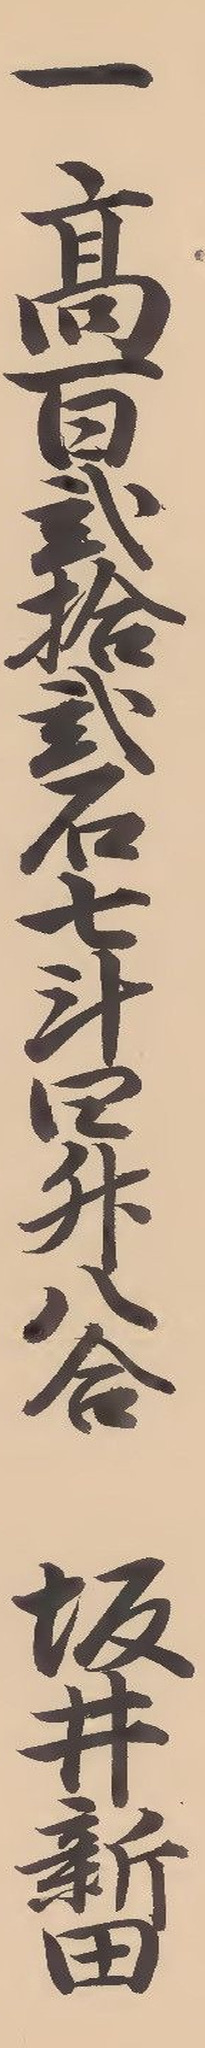一高百弐拾弐石七斗四升八合坂井新田
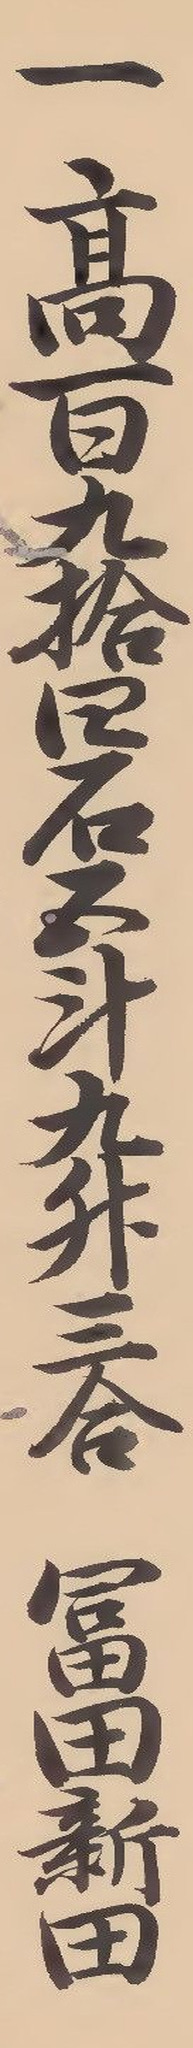一高百九拾四石五斗九升三合富田新田

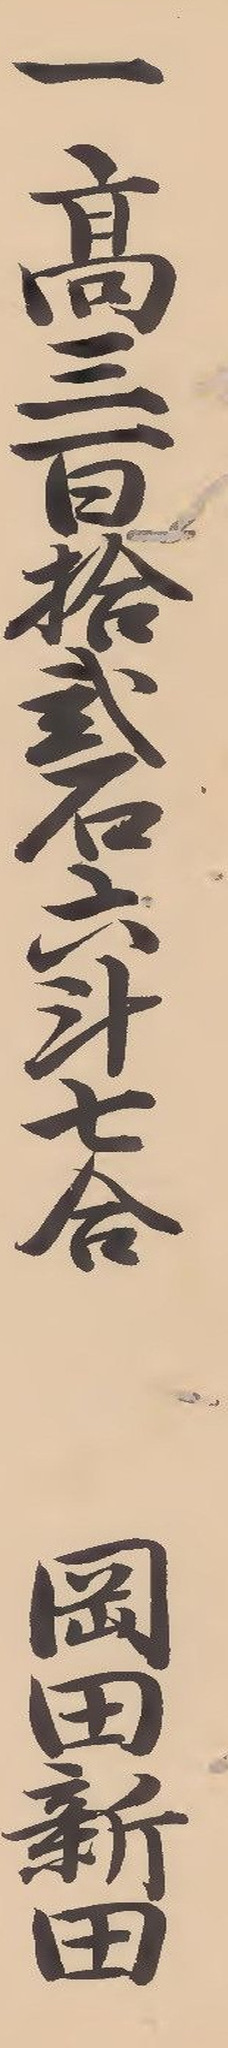一高三百拾弐石六斗七合岡田新田
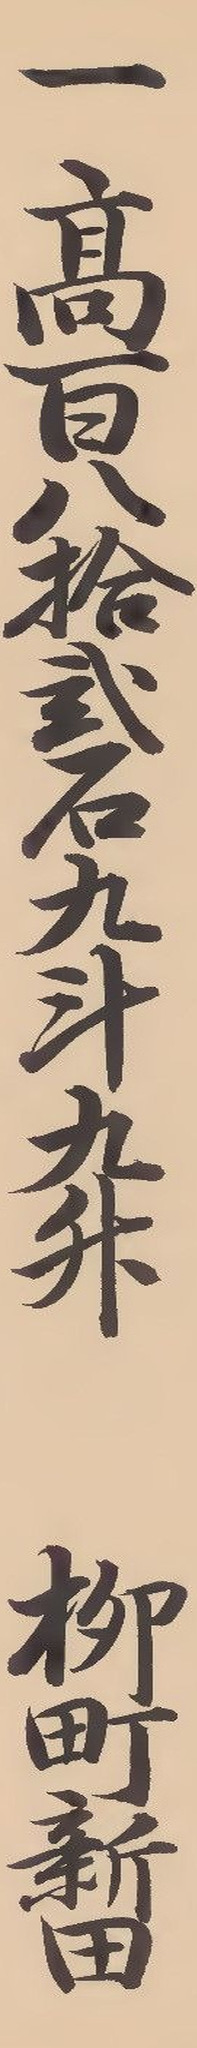一高百八拾弐石九斗九升柳町新田
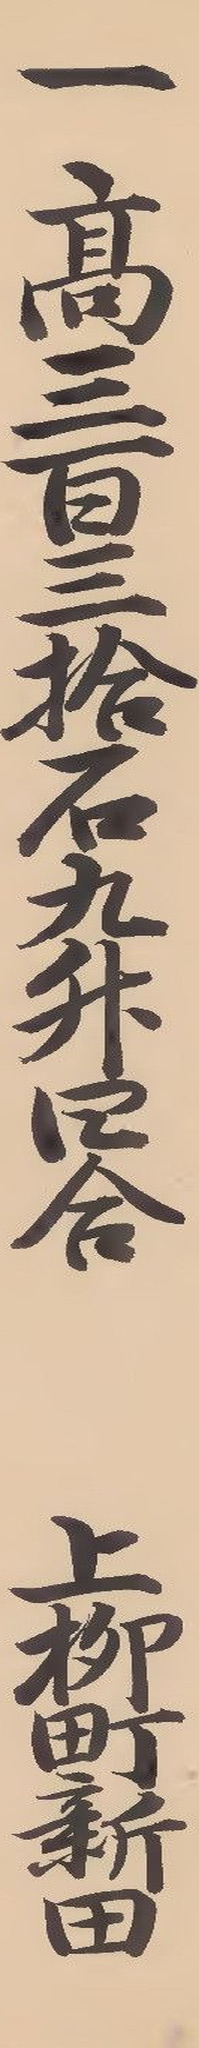一高三百三拾石九升四合上柳町新田
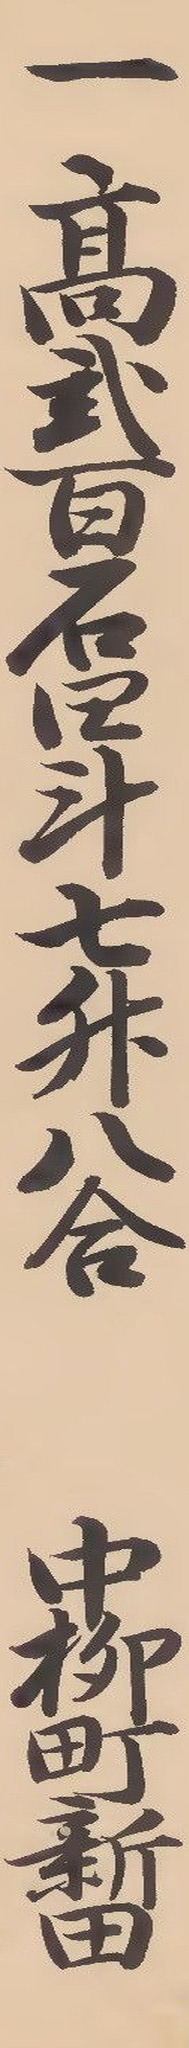一高弐百石四斗七升八合中柳町新田
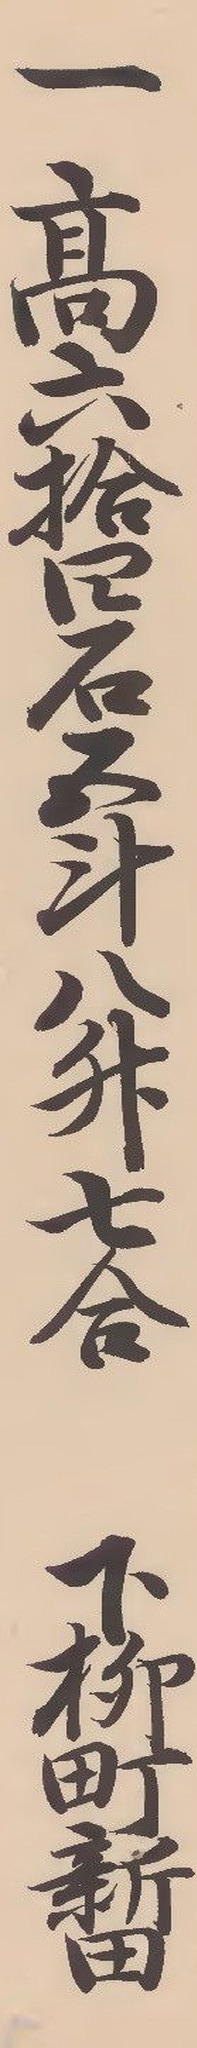一高六拾四石五斗八升七合下柳町新田
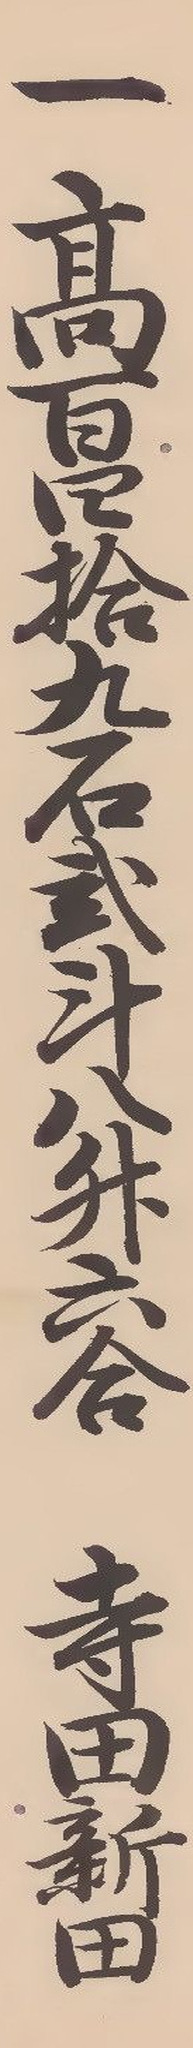一高百四拾九石弐斗八升六合寺田新田
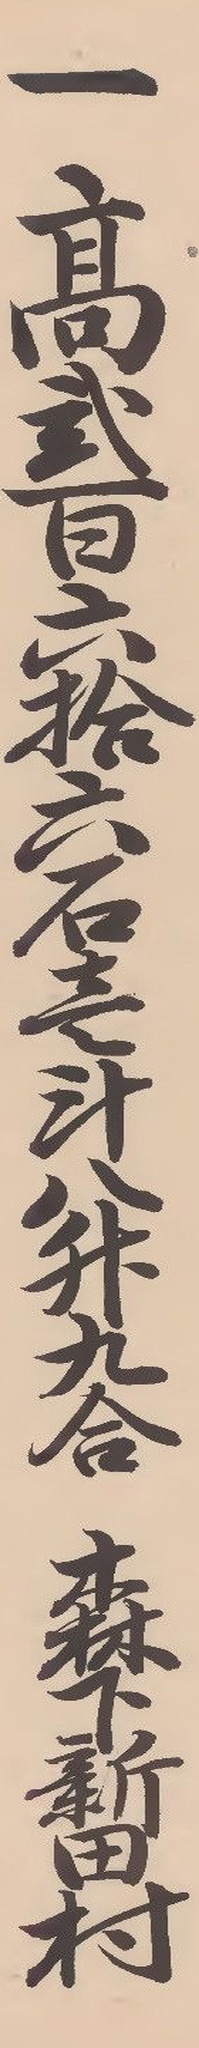一高弐百六拾六石壱斗八升九合森下新田村
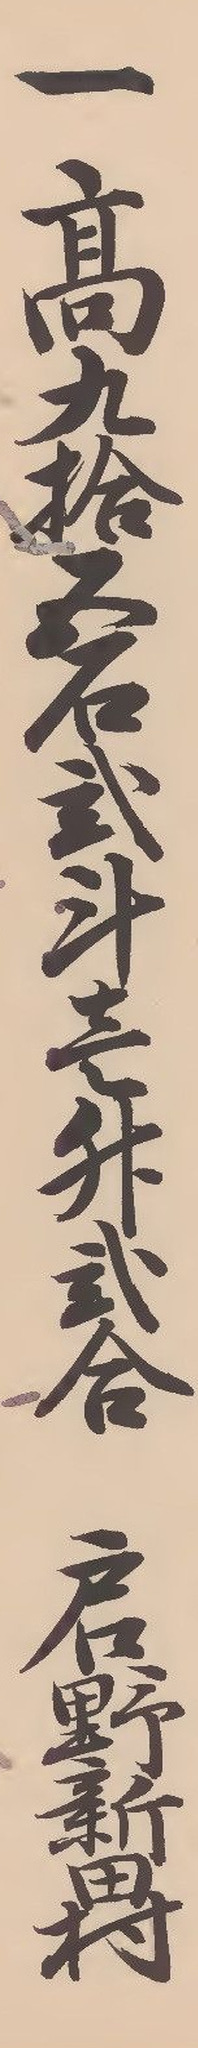一高九拾五石弐斗壱升弐合戸口野新田村

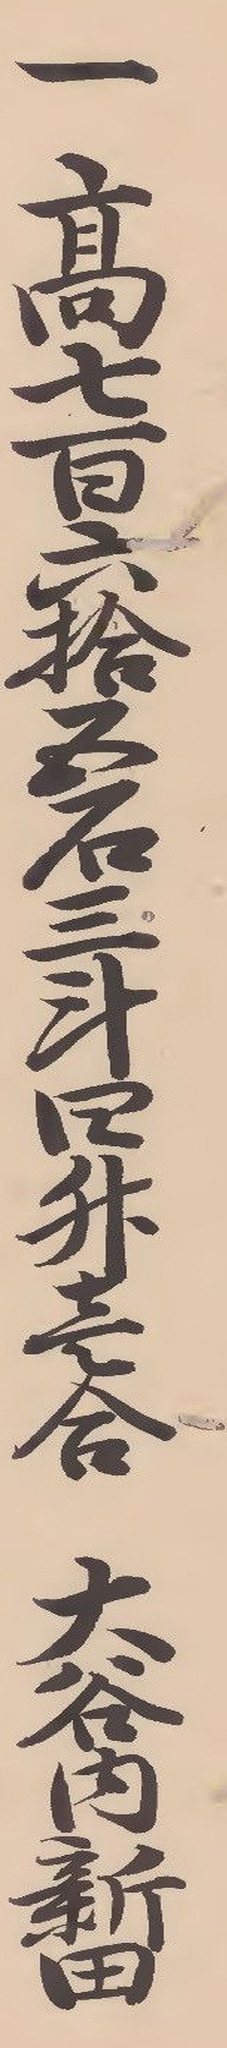一高七百六拾五石三斗四升壱合大谷内新田
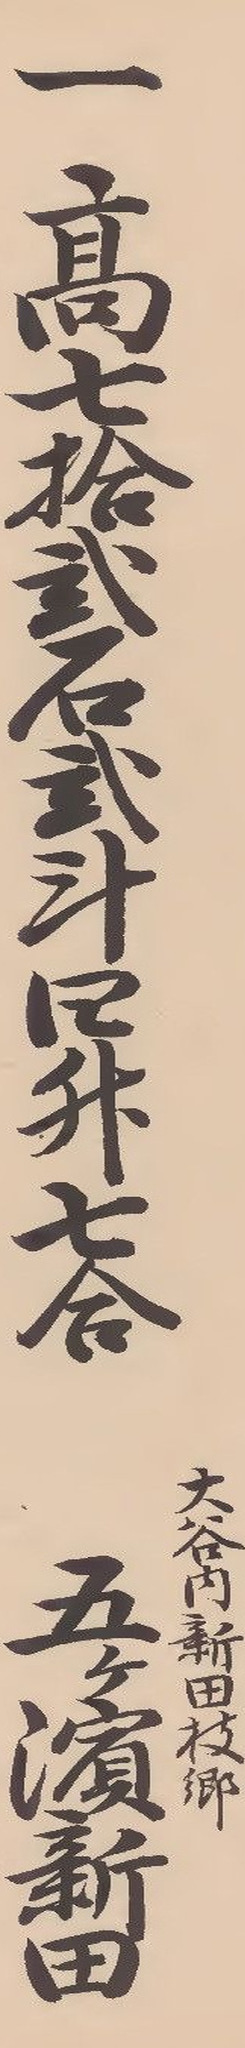一高七拾弐石弐斗四升七合五ヶ浜新田
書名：越後国郷帳　上
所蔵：国立公文書館 National Archives of Japan
